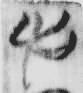左
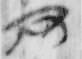尹
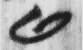㠯（以）
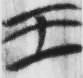王
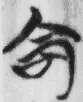命
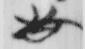告
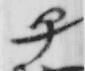子
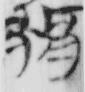○（宛）
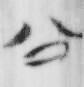公
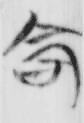命
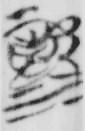○（遣）
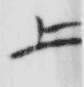上
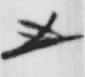之
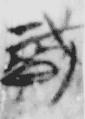戠
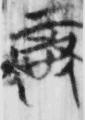獄
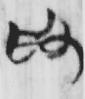爲
